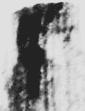東
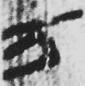方
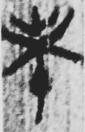未
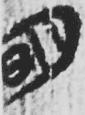明
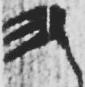又（有）
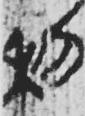利（利）
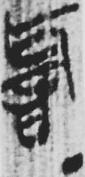○（詞）
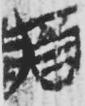𨟻（將）
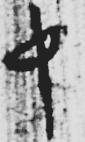中（仲）
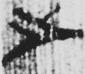之
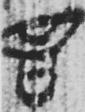言
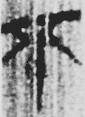不
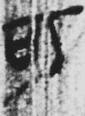可
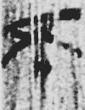不
